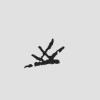至
